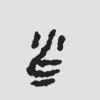水
